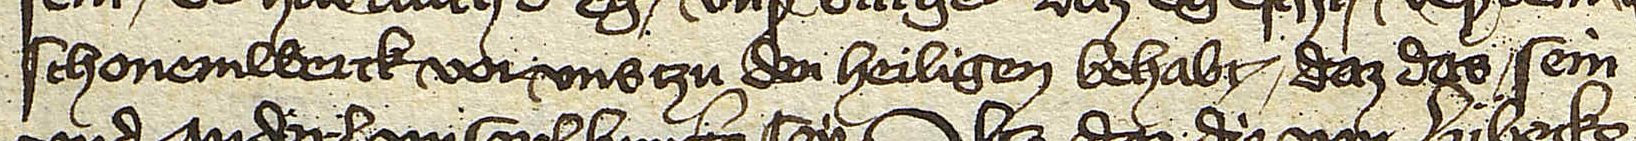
ſchonemwerck vor vns cʒu den heiligen behabt / daʒ das / ſein
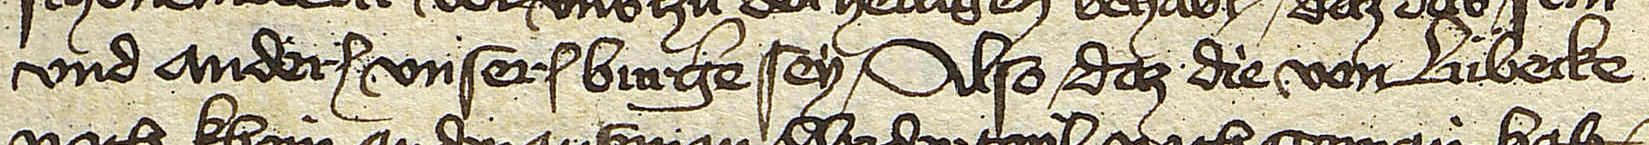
vnd ander* vnſer* burge* ſey / Alſo / daʒ die von Lübecke
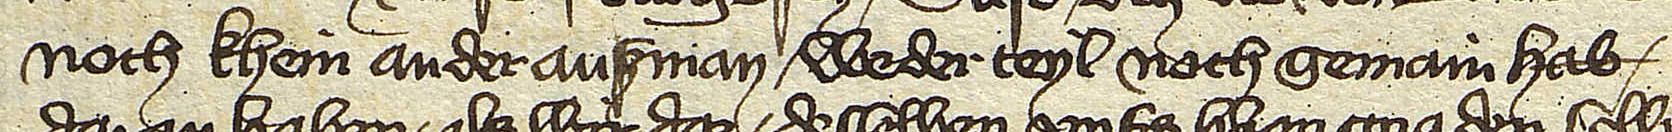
noch khein ander auſʒman / weder teyl noch gemain hab /
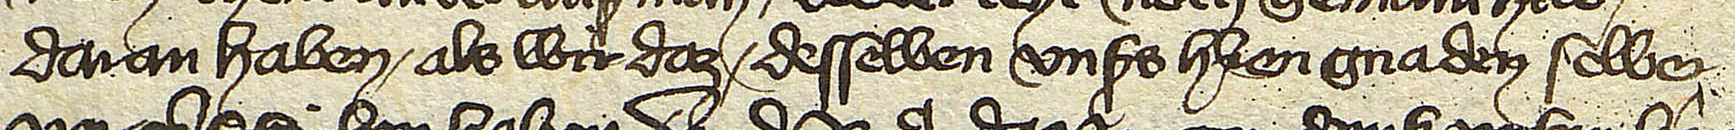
daran haben / als wir daʒ / deſſelben vnſ*s h*ren gnaden ſelber
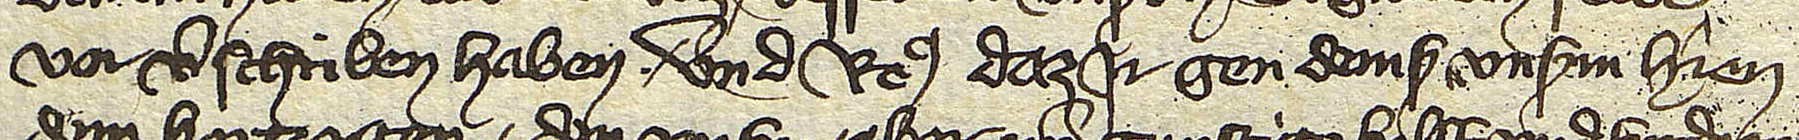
vor v*ſchriben haben . / Vnd Ro* daʒ Ir gen demſ* vnſ*m h*ren
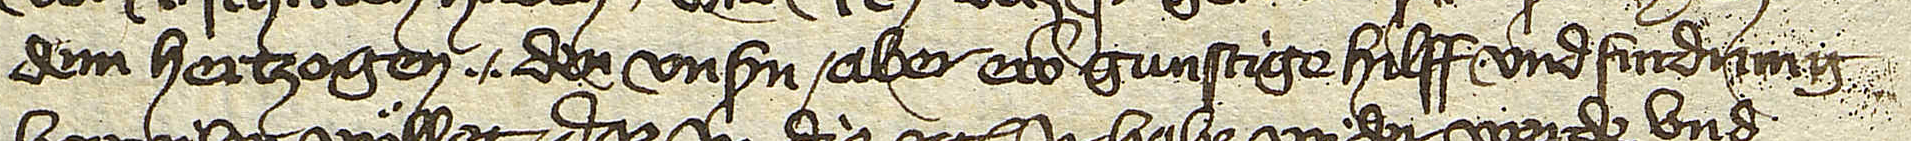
dem hercʒogen . / . den vnſ*n / aber ew* gunſtige hilff vnd furdrung
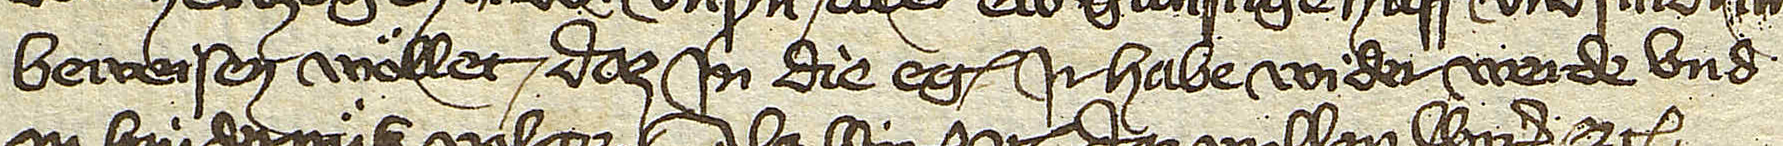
beweiſen wöllet / daʒ In die eg* Ir habe wider werde vnd
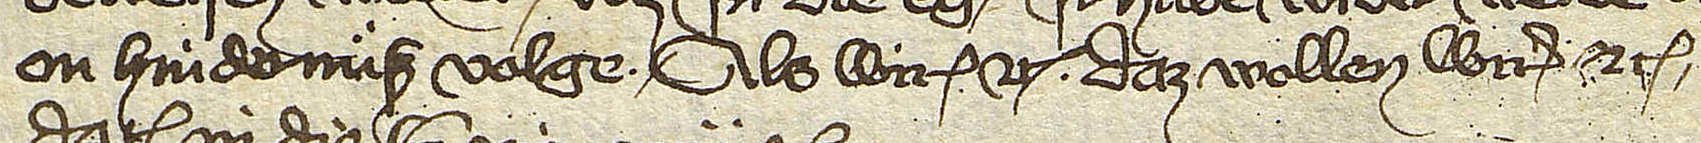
on hindernüſʒ volge . / Als wir* ec* . daʒ wollen wir ec* /
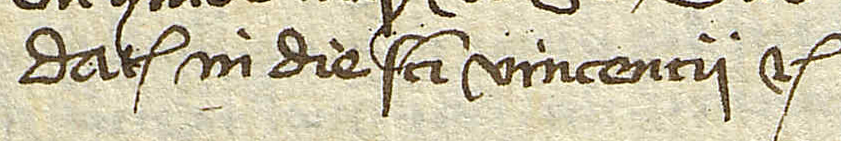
dat* in die ſci* vincentii* ec*
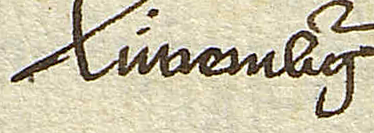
lünembg*
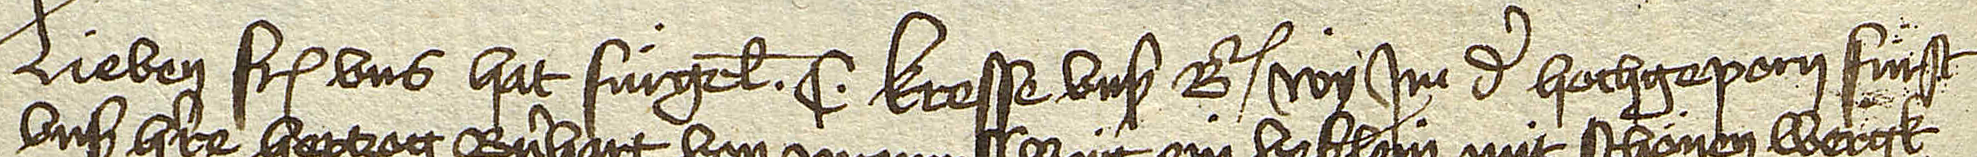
Lieben fr* vns hat fürgel* . C . Kreſſe vnſ* B* wy Im d* hochgeporn fürſt
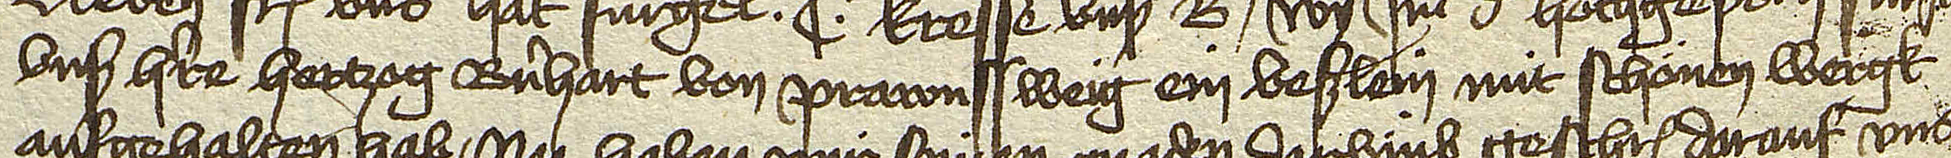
vnſ* h*re hertʒog Bn*hart von Prawnſſweig ein veſʒlein mit ſchönen wergk
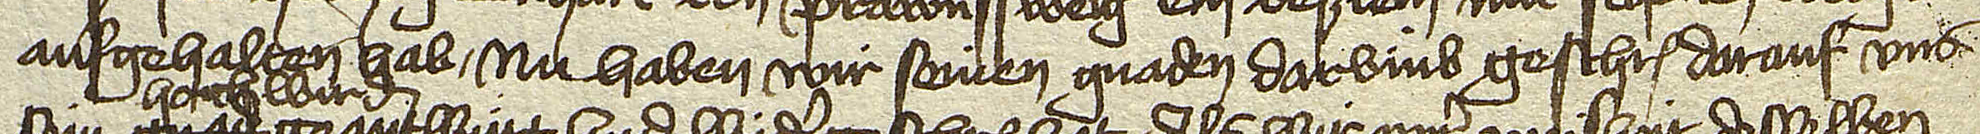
aufgehalten hab / Nu haben wir ſeinen gnaden darv̈mb geſchr* darauf vns
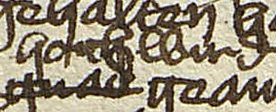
hochwird*
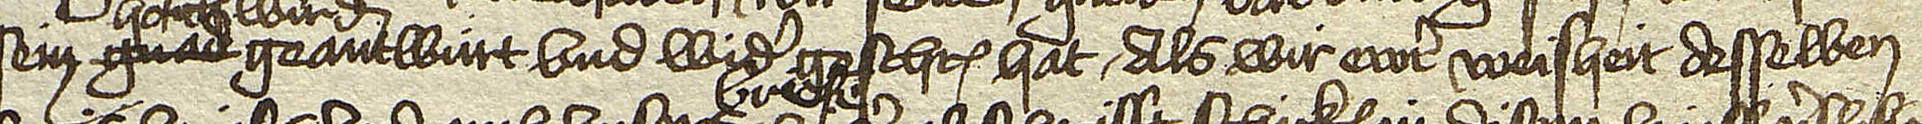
ſein gnad geantwürt vnd wid* geſchr* hat / Als wir ewn* weiſheit deſſelben
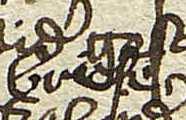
briefs
